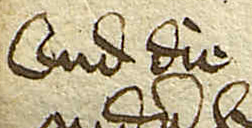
vnd die
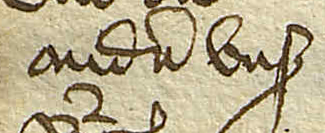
andn* vnſ*
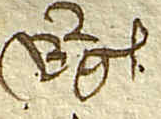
B*g*.
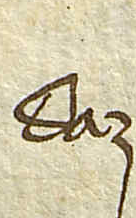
daʒ
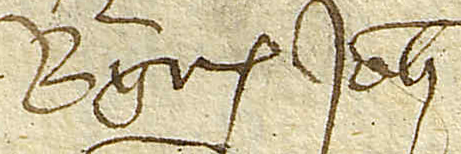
B*gr* Ioh*
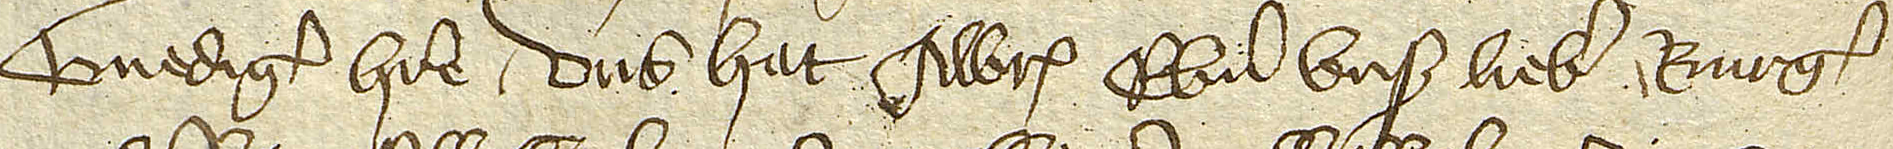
Gnedig* hr*e / vns hat Albr* Ebn* vnſ* lieb* Burg*
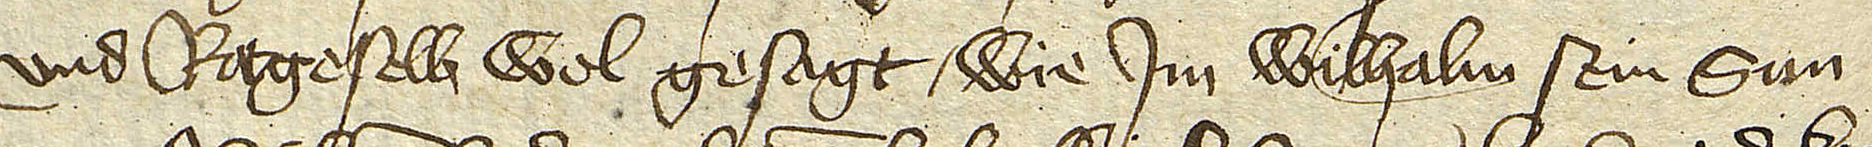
vnd Ratgeſell wol geſagt / wie Im wilhalm ſein Sun
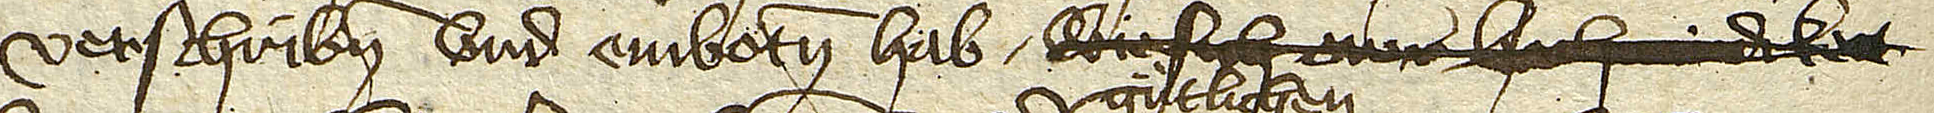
verſchribn* vnd embotn* hab / wie ſich ewr* hochwirdikeit
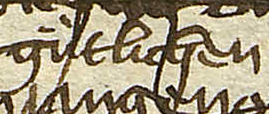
gütlichen
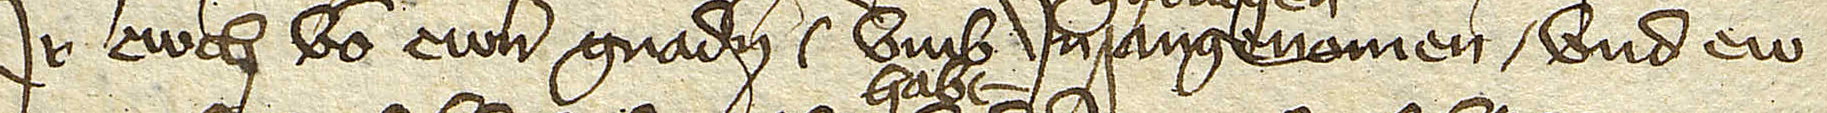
Ir ewch vo* ewn* gnadn* / vmb In angenomen / vnd ew
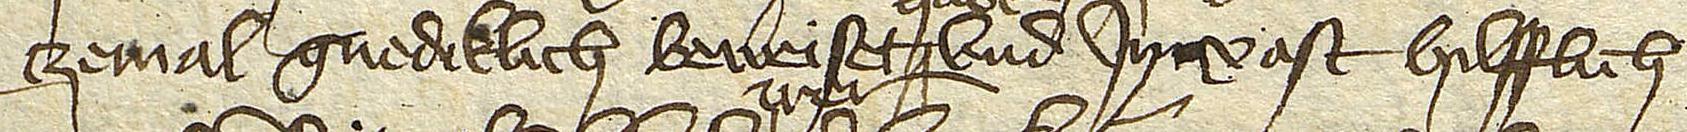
cʒemal gnediklich beweiſet vnd In vaſt hilfflich
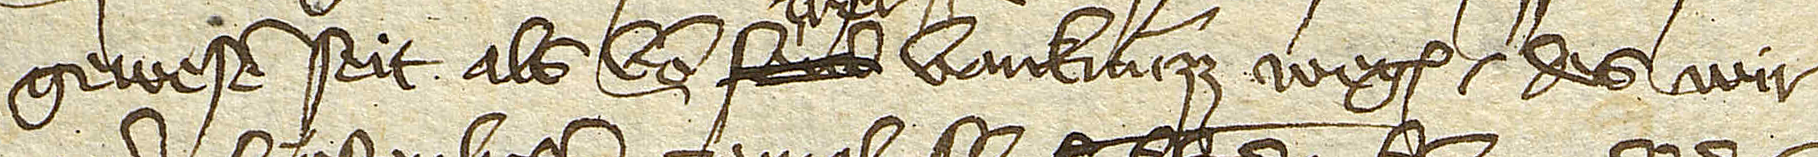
geweſe* ſeit als vo* ſein* vanknüʒʒ weg* / des wir
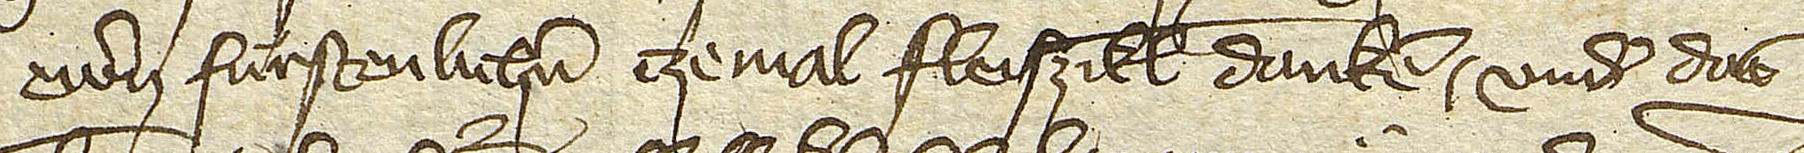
ew*n fürſtenlichn* cʒemal fleiſʒikl* danke* / vnd das
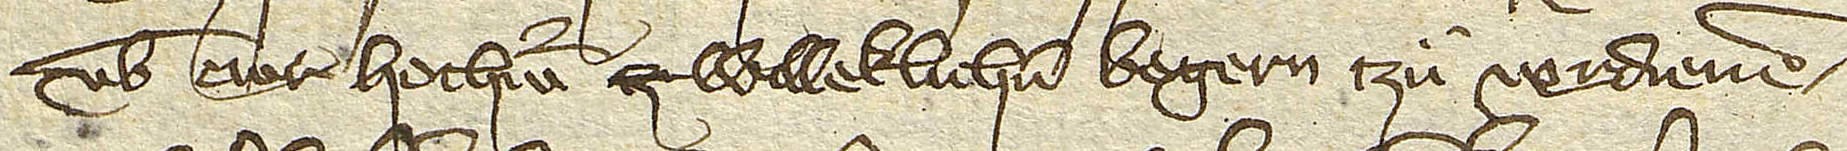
vb* ewr hochw* cʒ willeklichn* begern cʒü verdiene* /
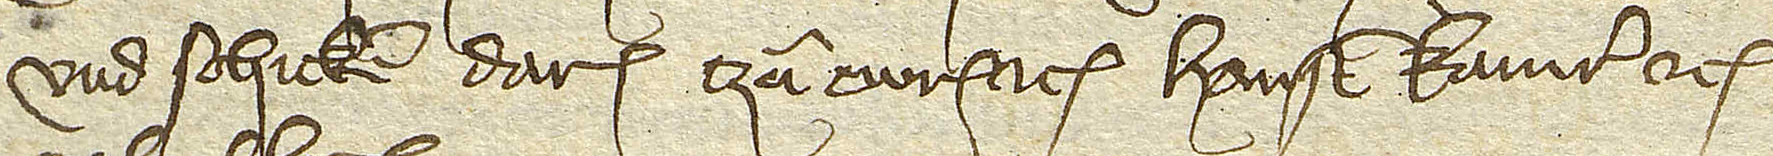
vnd ſchicke* dar* cʒü ewr* ec* hanſe* kamr* ec*
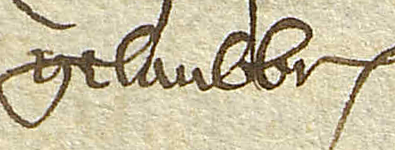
gelaubbr*
